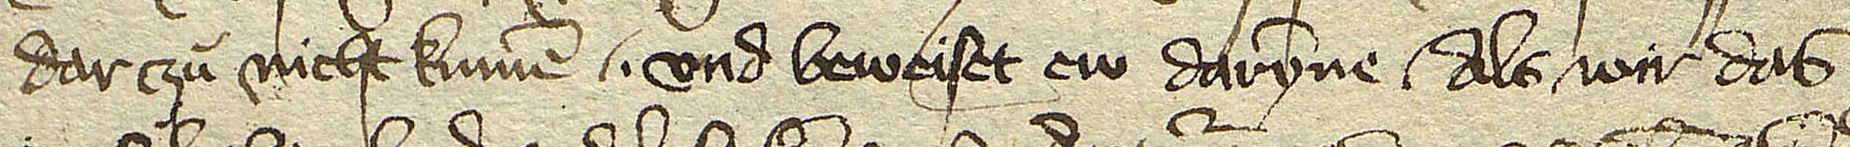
darcʒü nicht kume* / . vnd beweiſet ew daryne* / Als wir das
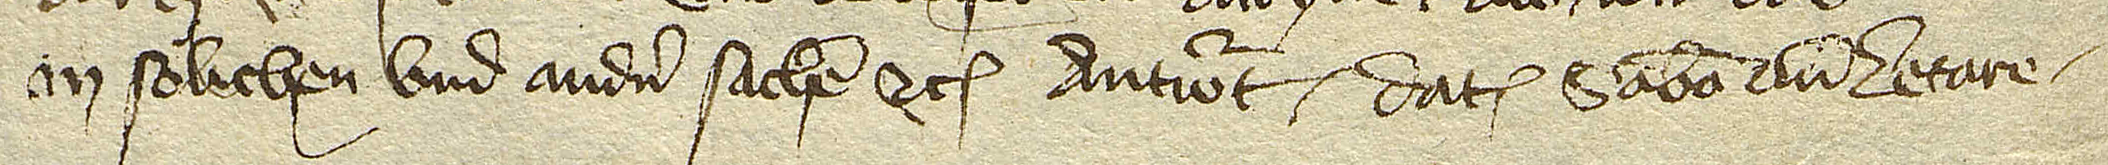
in ſölichen vnd andn* ſache ec* Antwt* / dat* Saba* an* Letare /
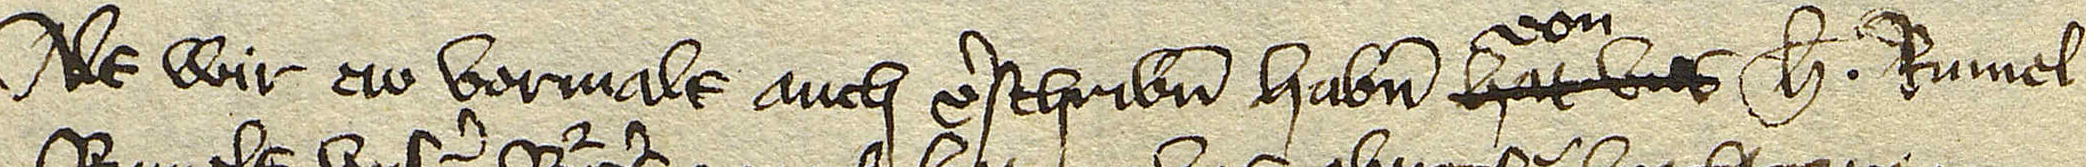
Als wir ew vormals auch v*ſchribn* habn* hat vns h* . Rumel
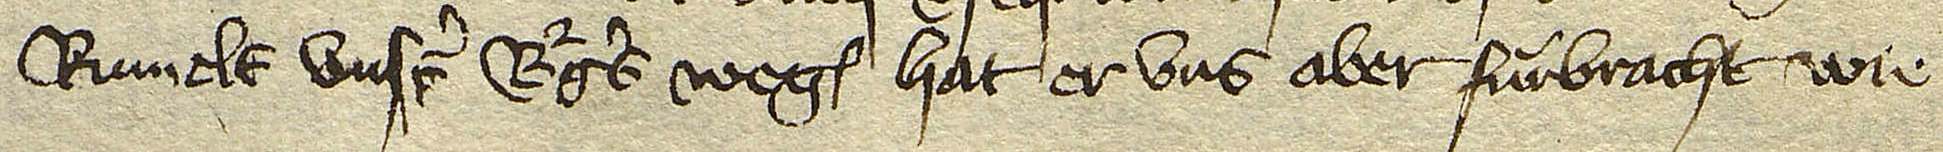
Rumels vnſs* B*g*s weg* hat er vns aber fürbracht wie
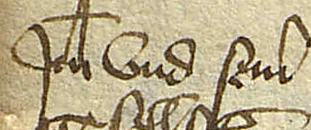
Im vnd ſein*
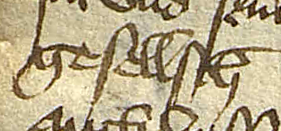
geſellſch*
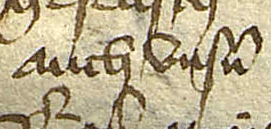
auch vnſn*
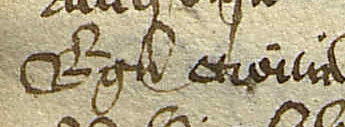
B*gn* etwiuil
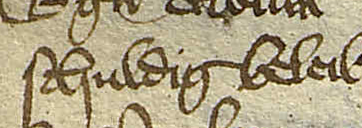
ſchuldig beleib
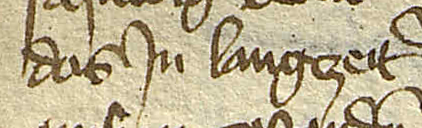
das In langcʒeit
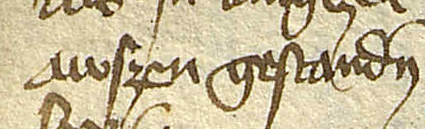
awſʒen geſtandn*
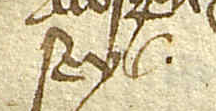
ſey / .
